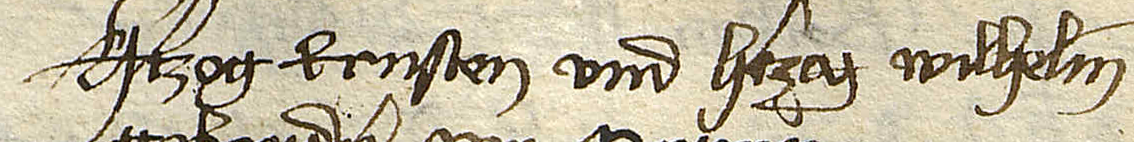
H*cʒog Ernſten vnd h*cʒog wilhelm
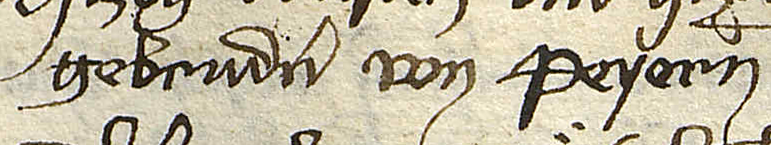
gebrud*n von Peyern
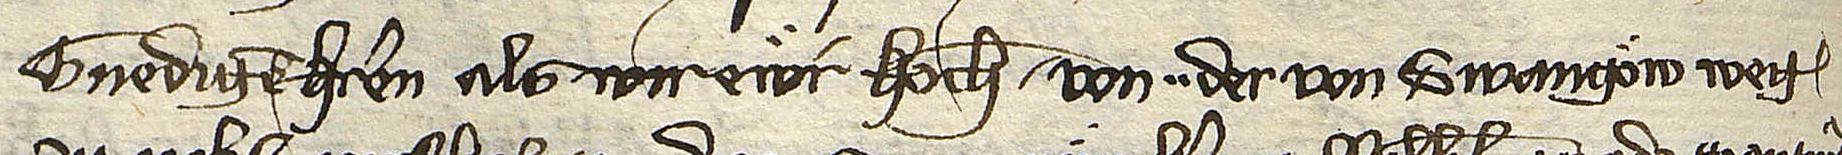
Gnedig*e h*ren als wir ewr* hoch* von ~ der von Swangöw weg*
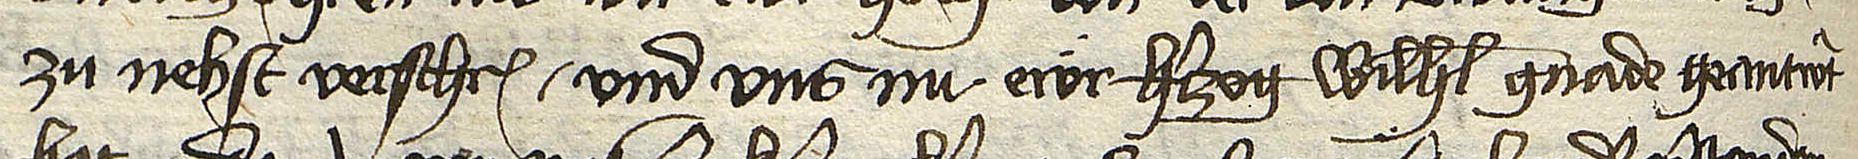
ʒu nehſt verſchr* / vnd vns nu ewr h*cʒog Wilhl* gnade geantw*t
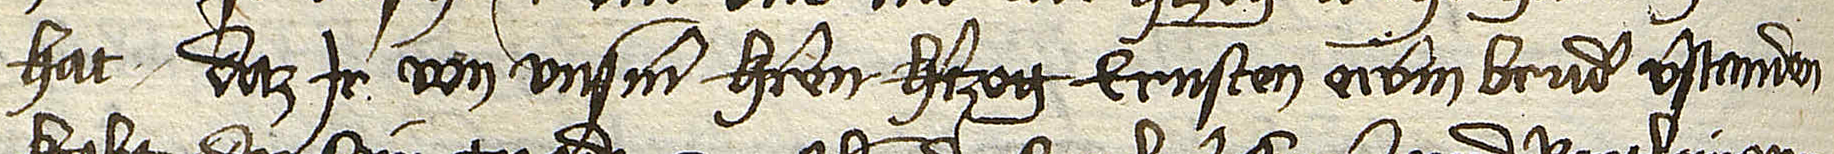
hat / daʒ Ir von vnſ*m h*ren h*cʒog Ernſten ew*m brud* v*ſtanden
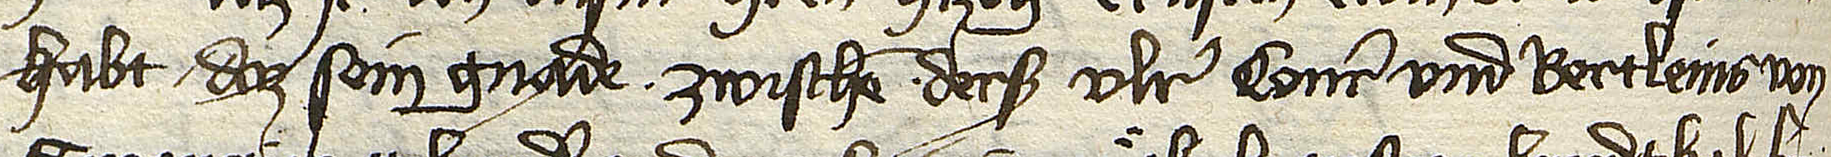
habt / daʒ ſein gnade . ʒwiſche* derſ* vlr* Conr* vnd Bertleins von
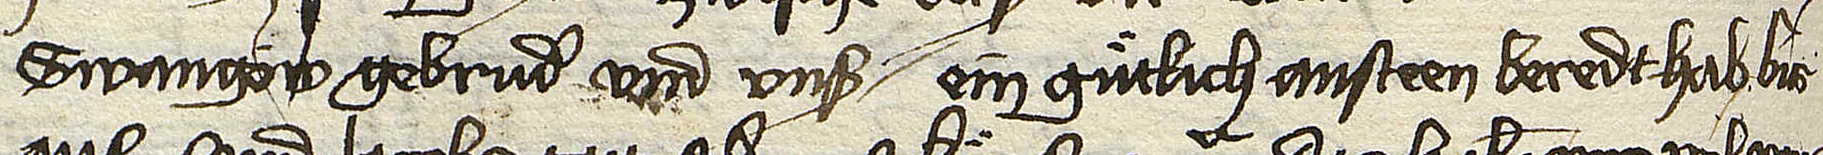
Swangöw gebrud* vnd vnſ* / ein gütlich anſteen beredt hab bis
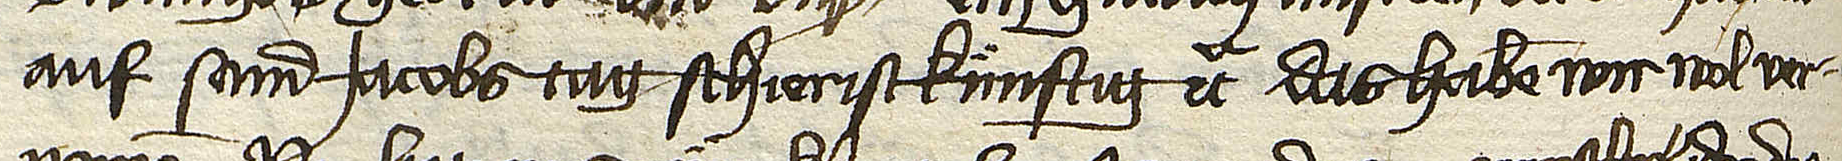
auf ſand Iacobs tag ſchieriſt künftig ec* / das habe* wir wol ver =
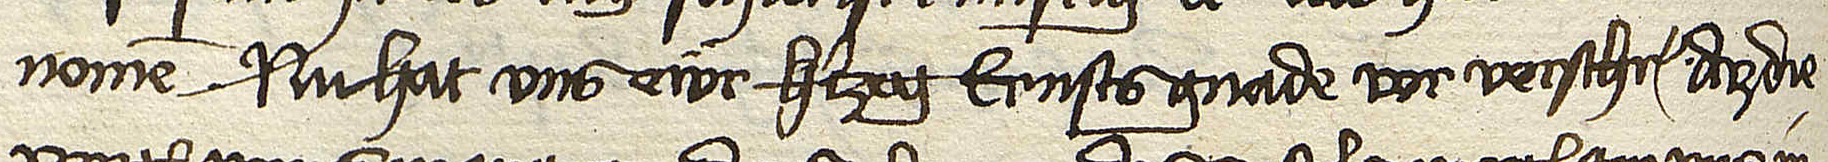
nome* . Nu hat vns ewr h*cʒog Ernſts gnade vor verſchr* . daʒ die
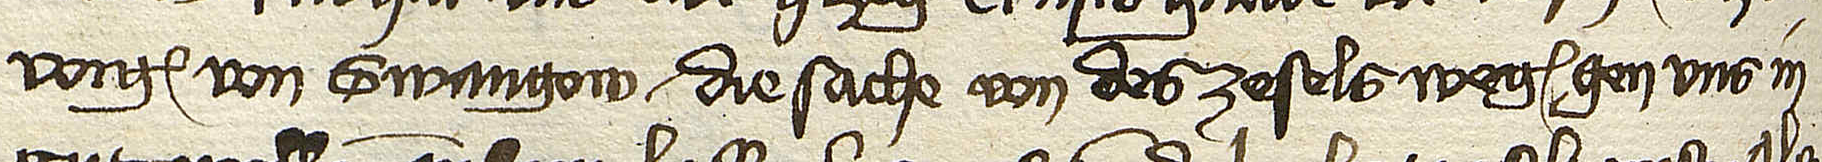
vorg* von Swangow / die ſache von des ʒeſels weg* gen vns in
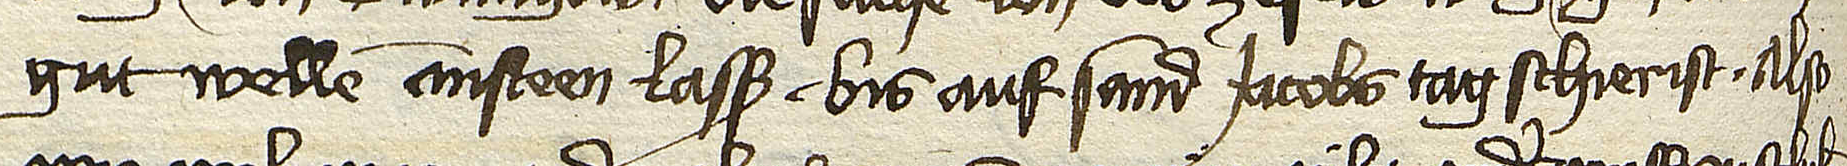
gut welle* anſteen laſſ* / bis auf ſand Iacobs tag ſchieriſt . Alſo
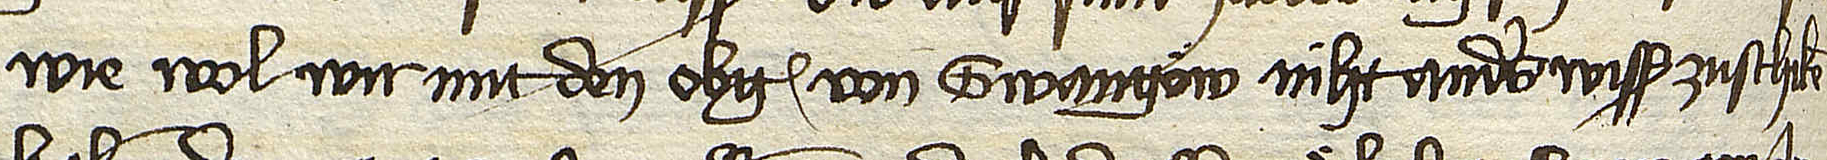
wie wol wir mit den obg* von Swangöw niht and*s wiſſ* ʒuſchike*
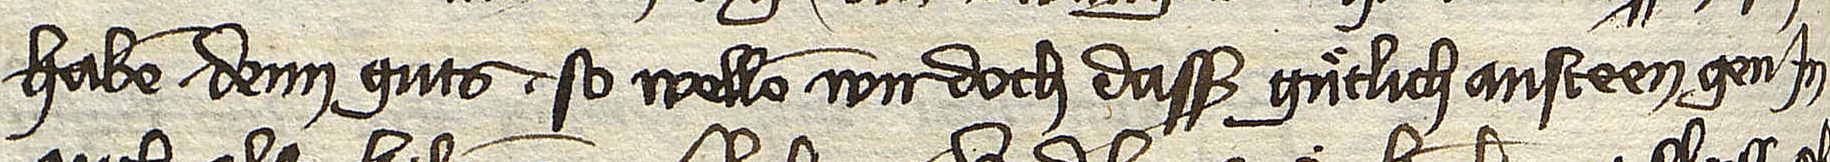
habe* / denn guts . ſo welle* wir doch daſſ* gütlich anſteen gen In
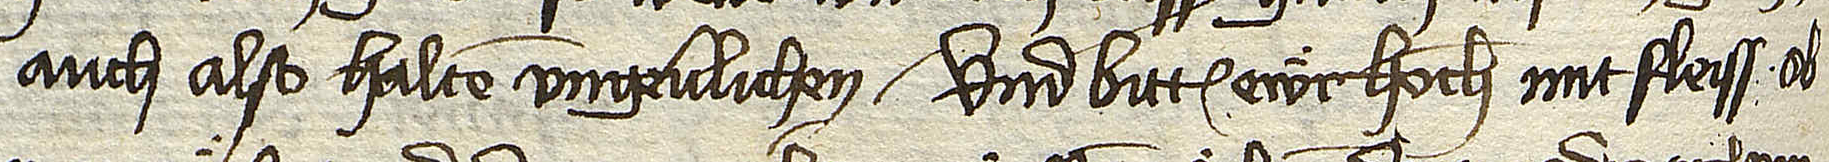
auch alſo halte* vngeu*lichen / Vnd bitt* ewr hoch* mit fleiſſ . Ob
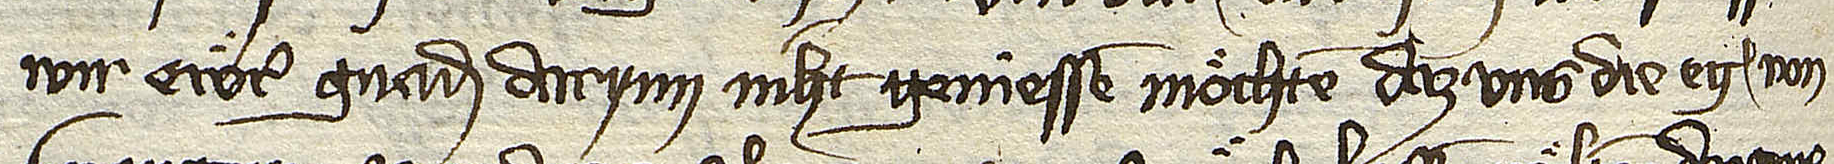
wir ewr* gnad* darynn niht genieſſe* möchte daʒ vns die eg* von
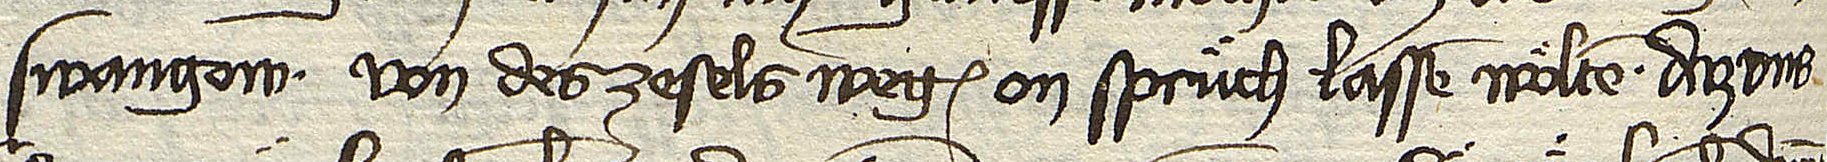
ſwangow . von des ʒeſels weg* on ſprüch laſſe* wölte* . daʒ vns
